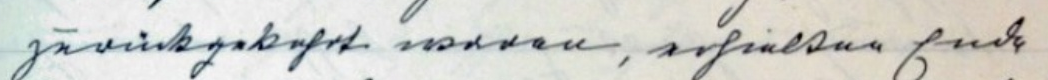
zurückgekehrt waren, erhielten Ende
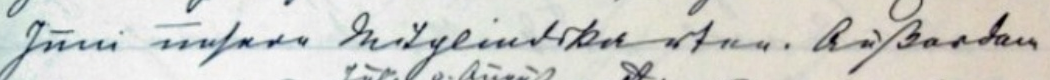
Juni unsere Mitgliedskarten. Außerdem
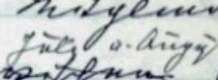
July und August
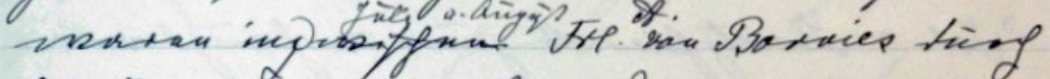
waren inzwischen Frl. v. Boraies durch
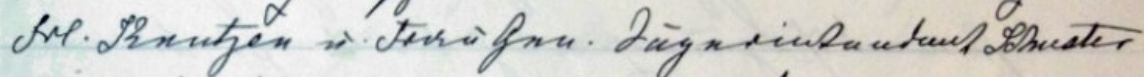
Frl. Knutzen u. Frau Gen. Superintendent Schuster
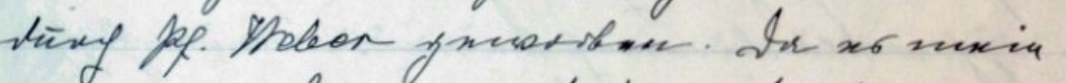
durch Pf. Weber geworben. Da es mein
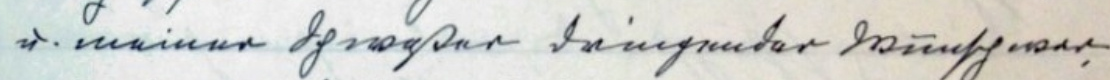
u. meiner Schwester dringender Wunsch war
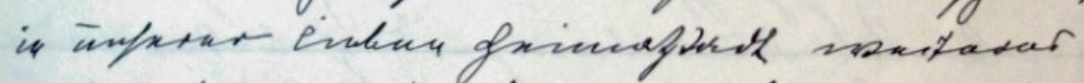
in unserer lieben Heimatstadt weiteres
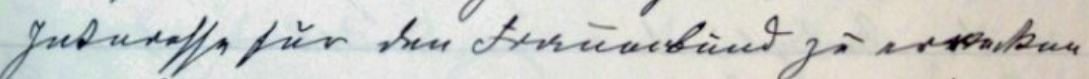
Interesse für den Frauenbund zu erwirken
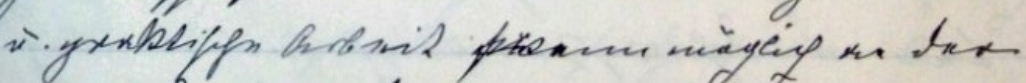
u. praktische Arbeit wenn möglich an der
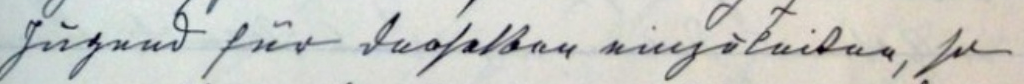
Jugend für denselben einzuleiten, so
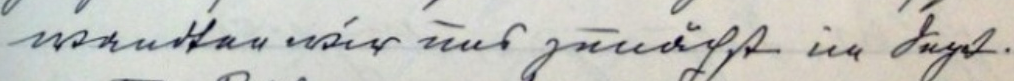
wandten wir uns zunächst im Text
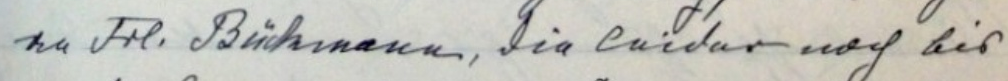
an Frl. Buckmann, die leider noch bis
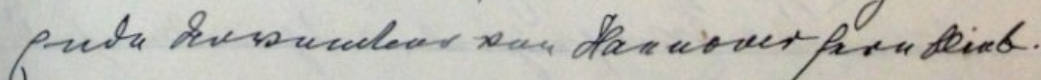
Ende November von Hannover fern blieb.
